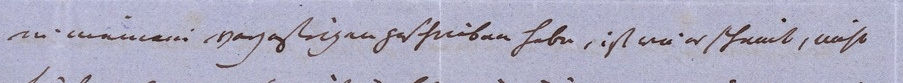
in meinem vorgestrigen geschrieben habe, ist wie es scheint, nicht
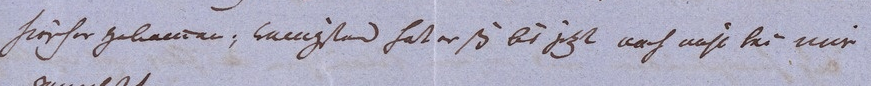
hierher gekommen; wenigstens hat er sich bis jetzt noch nicht bei mir
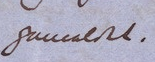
gemeldet.
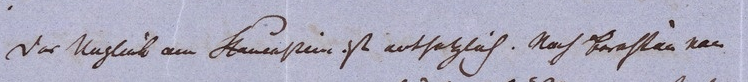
Das Unglück am Hauenstein ist entsetzlich. Nach Berichten von
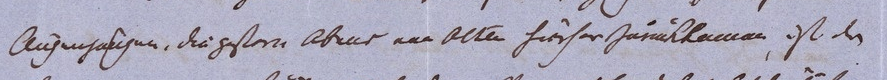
Augenzeugen, die gestern Abend von Olten hierher zurückkamen, ist der
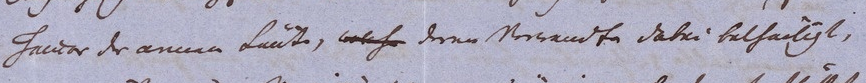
Jammer der armen Leute, deren Verwandte dabei betheiligt,
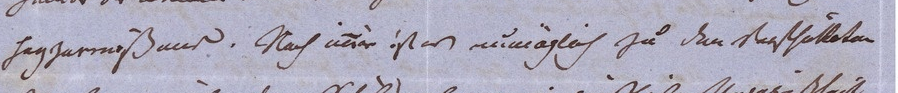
herzzerreißend. Noch immer ist es unmöglich zu den Verschütteten
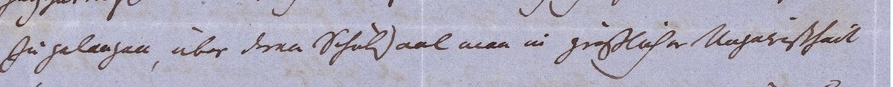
zu gelangen über deren Schicksaal man in gräßlicher Ungewißheit
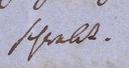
schwebt.
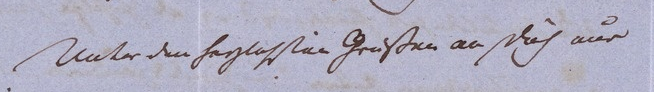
Unter den herzlichsten Grüßen an Dich und
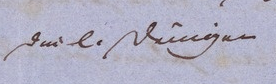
die l. Deinigen
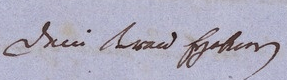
Dein treu Ergebener
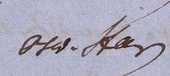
Osw. Heer
